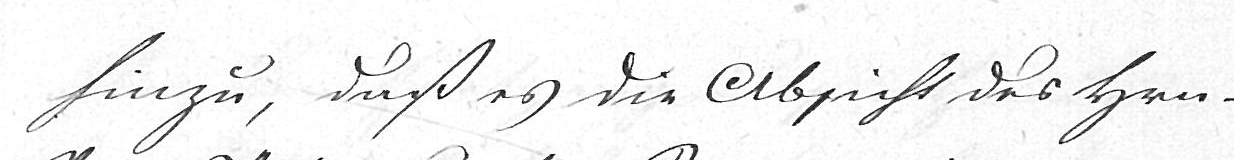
hinzu, daß es die Absicht des Hrn.
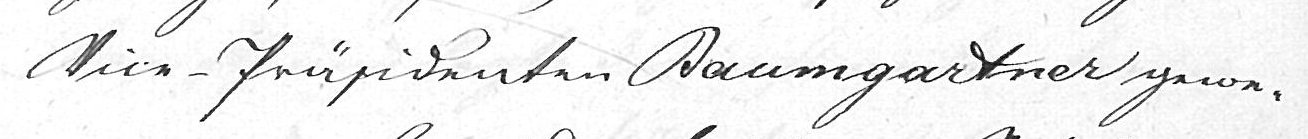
Vice-Präsidenten Baumgartner gewe-
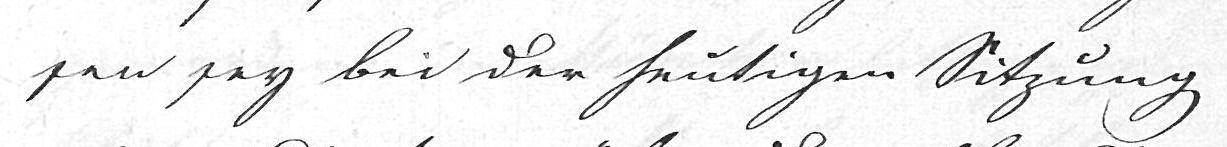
sen sey bei der heutigen Sitzung
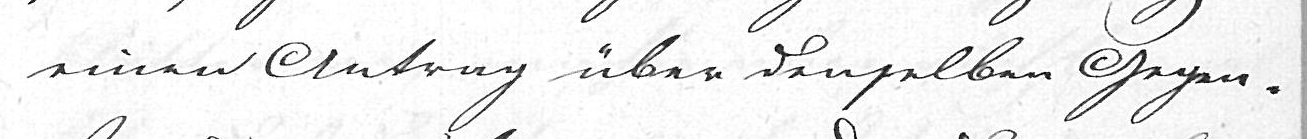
einen Antrag über denselben Gegen-
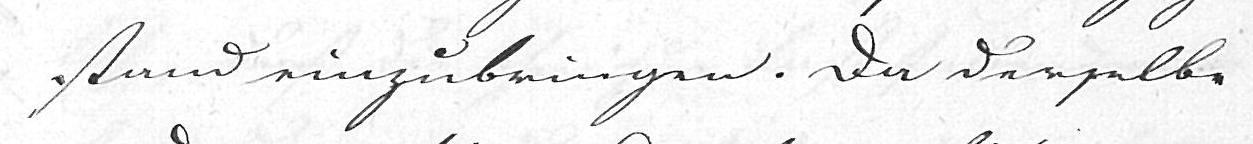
stand einzubringen. Da derselbe
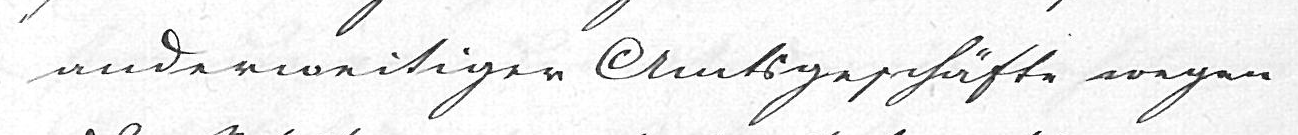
anderweitiger Amtsgeschäfte wegen
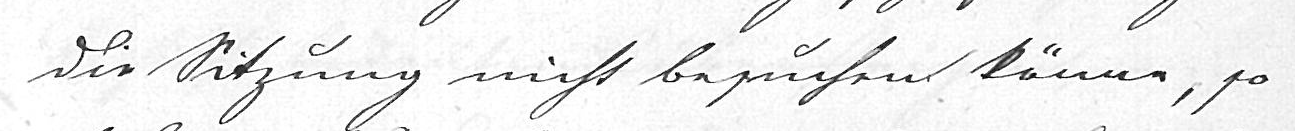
die Sitzung nicht besuchen könne, so
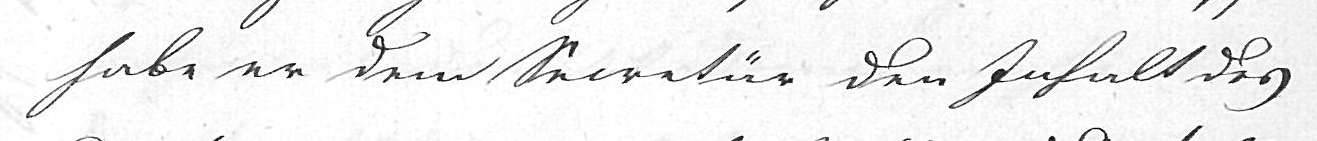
habe er dem Secretär den Inhalt des
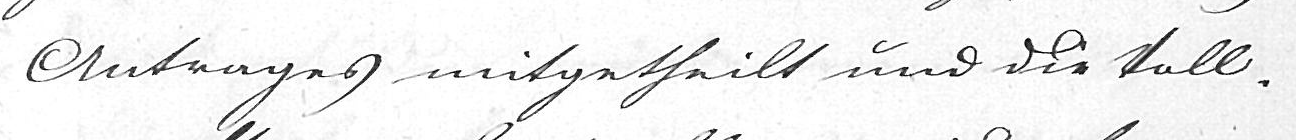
Antrages mitgetheilt und die Voll-
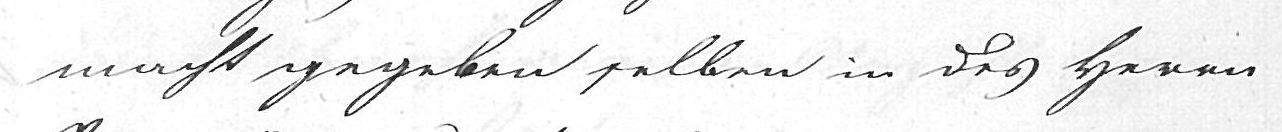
macht gegeben selben in des Herrn
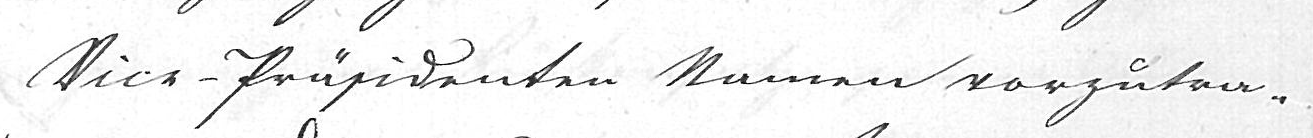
Vice-Präsidenten Namen vorzutra-
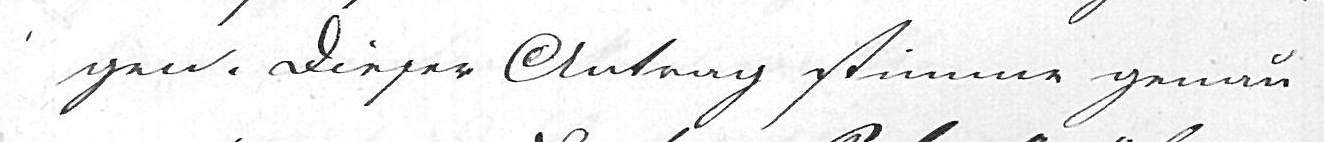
gen. Dieser Antrag stimme genau
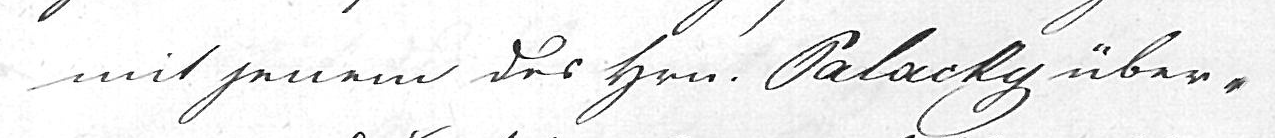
mit jenem des Hrn. Palacky über-
